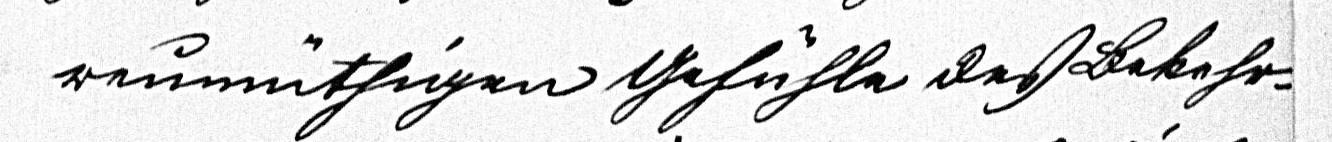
reumüthigen Gefühle des Bekehr¬
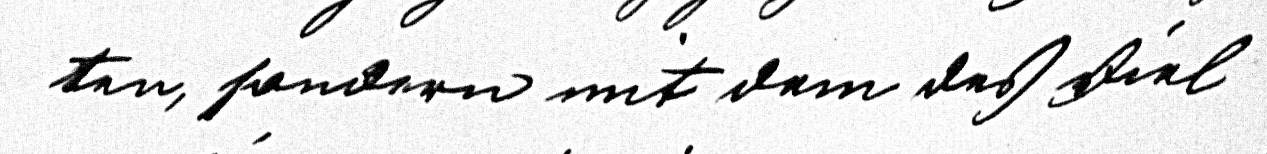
ten, sondern mit dem des Viel
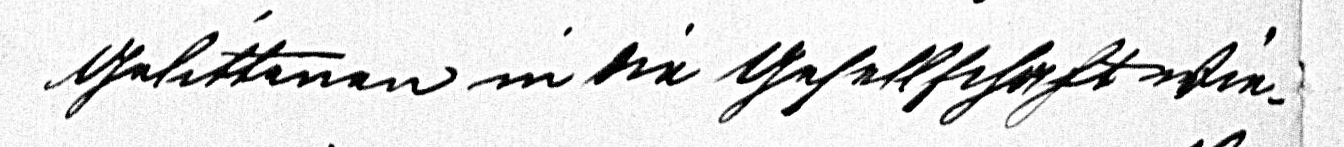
Gelittenen in die Gesellschaft
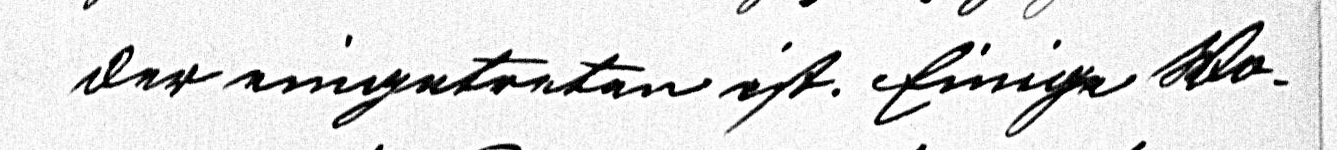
wieder eingetreten ist. Einige Wo¬
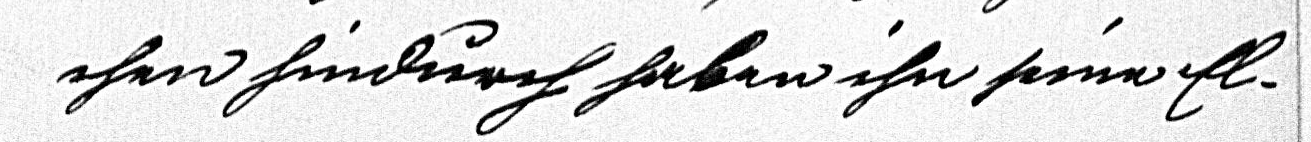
chen hindurch haben ihn seine El¬
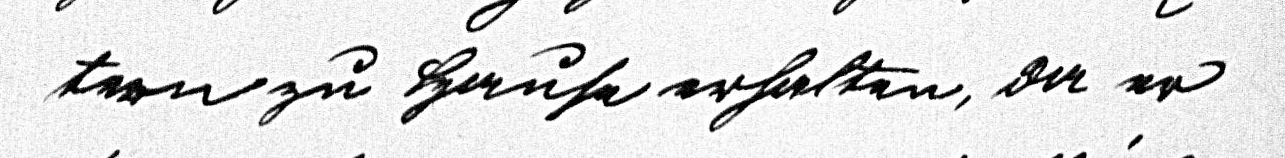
tern zu Hause erhalten, da er
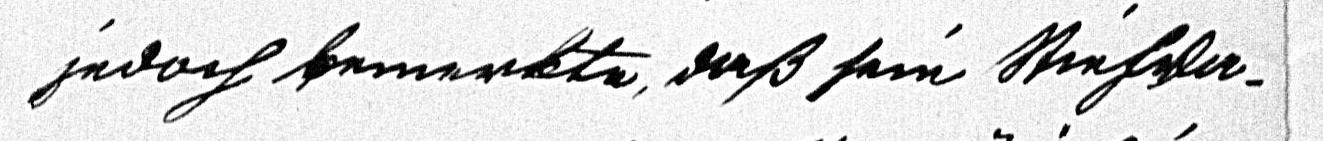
jedoch bemerkte, daß sein Stiefva¬
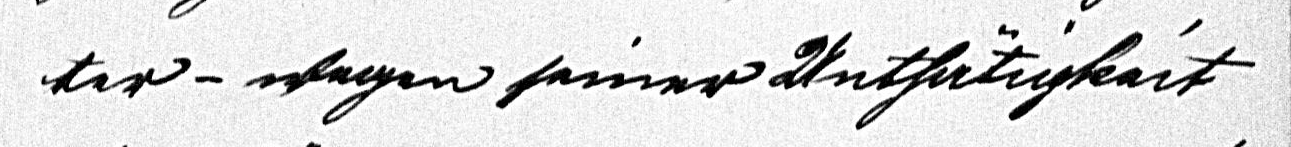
ter - wegen seiner Unthätigkeit
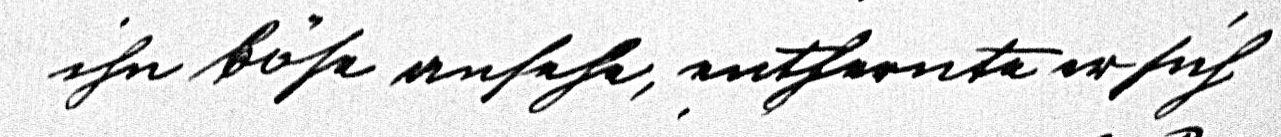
ihn böse ansehe, entfernte er sich
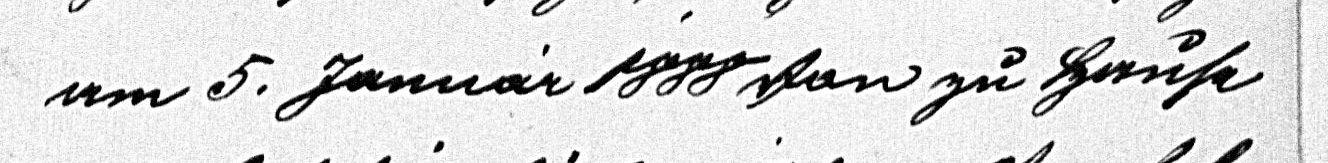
am 5. Január 1888 von zu Hause
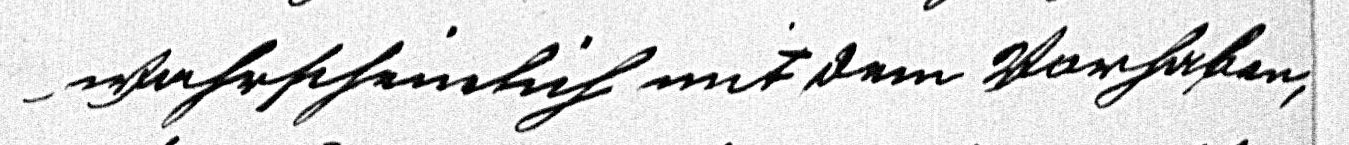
wahrscheinlich mit dem Vorhaben,
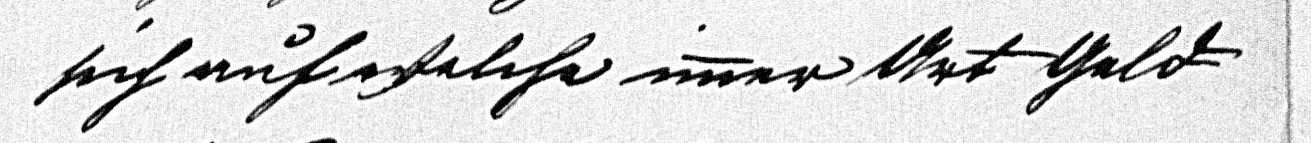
sich auf welche immer Art Geld
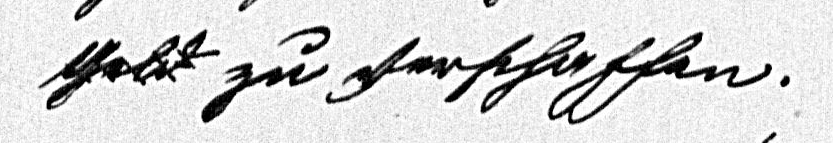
zu verschaffen.
